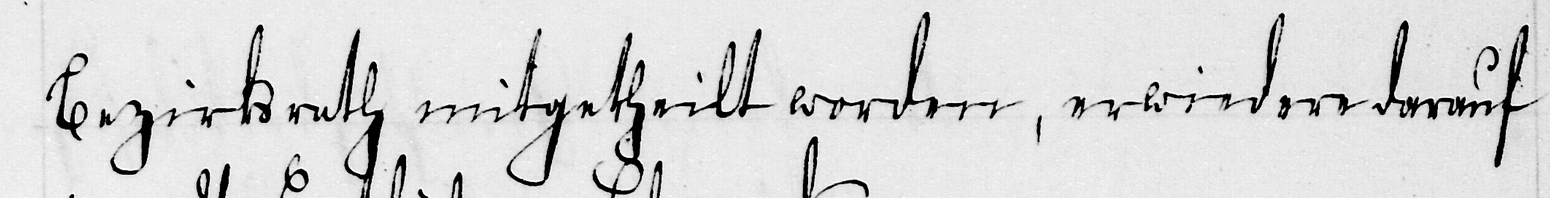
Bezirksrath mitgetheilt worden, erwiedere darauf
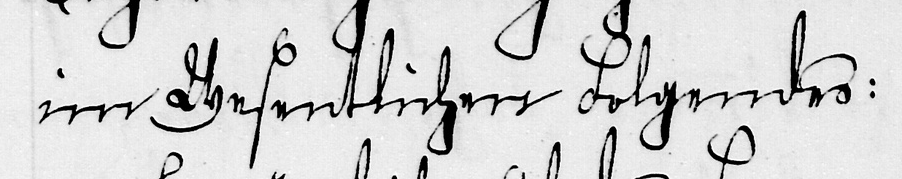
im Wesentlichen Folgendes:
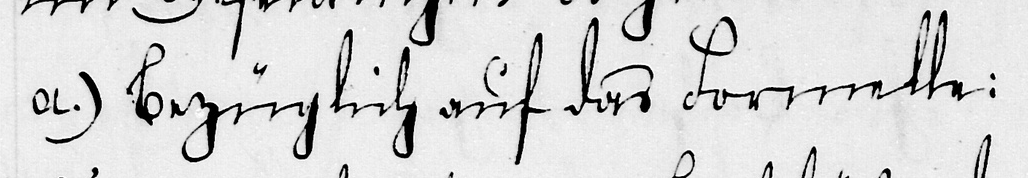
a.) Bezüglich auf das Formelle:
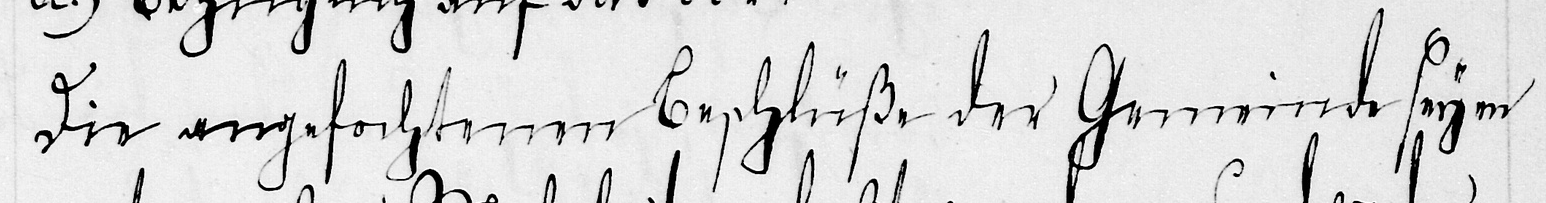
Die angefochtenen Beschlüße der Gemeinde seyen
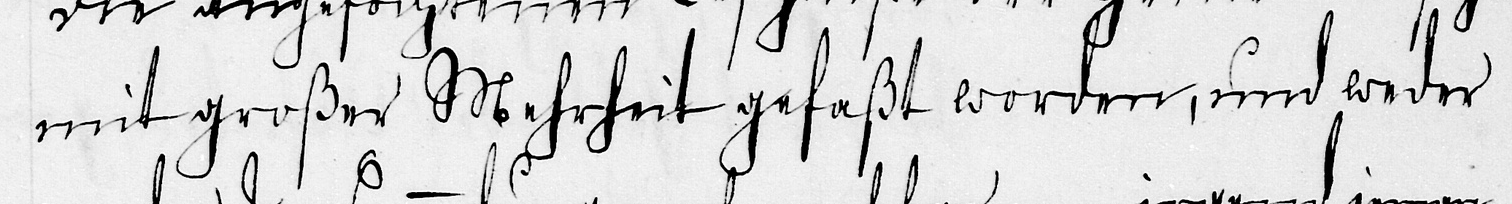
mit großer Mehrheit gefaßt worden, und weder
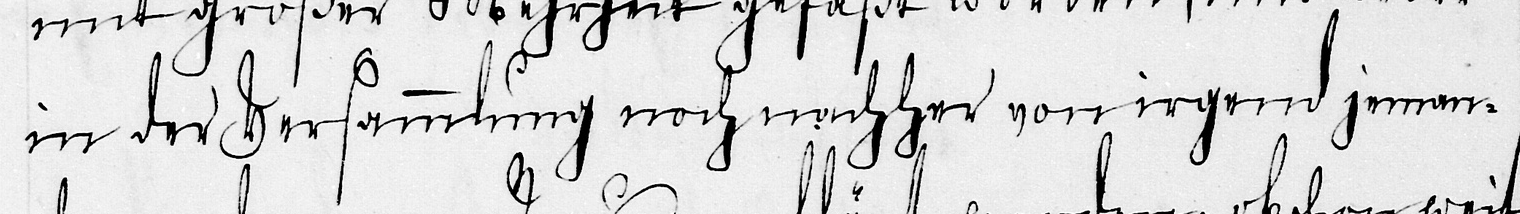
in der Versammlung noch nachher von irgend jeman¬
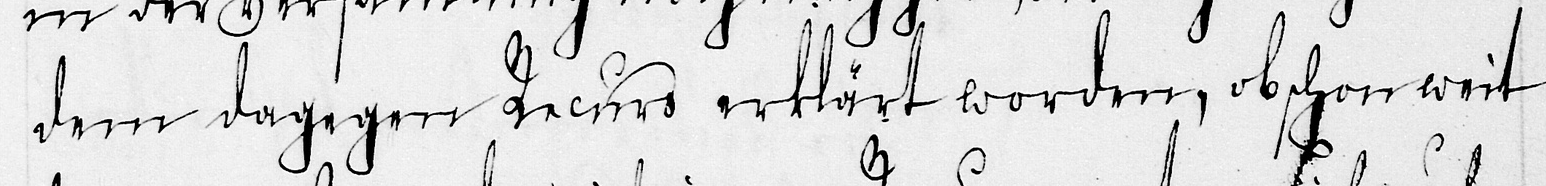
dem dagegen Recurs erklärt worden, obschon weit
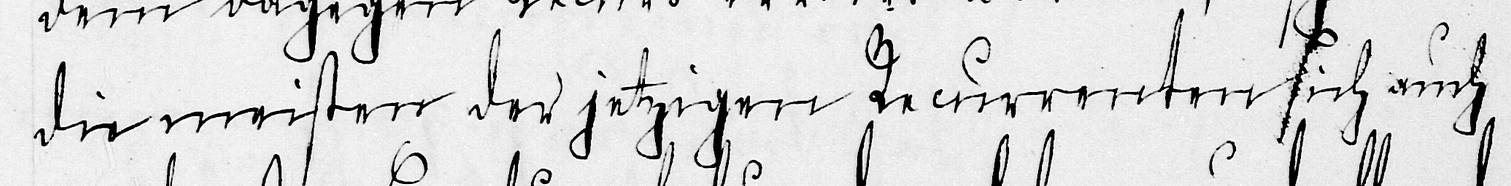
die meisten der jetzigen Recurrenten sich auch
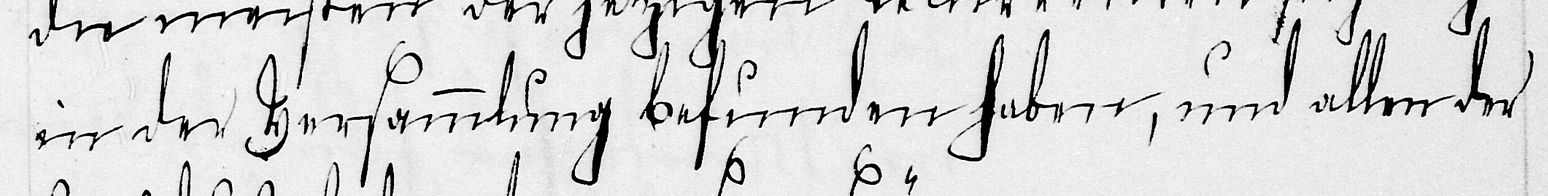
in der Versammlung befunden haben, und allen der
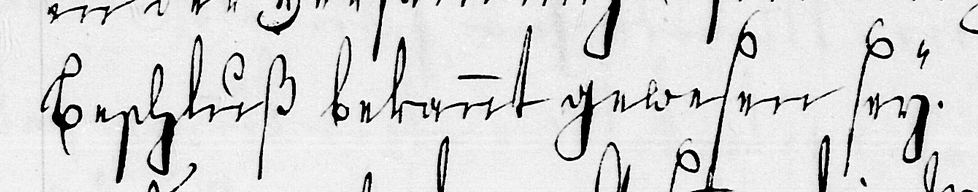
Beschluß bekannt gewesen sey.
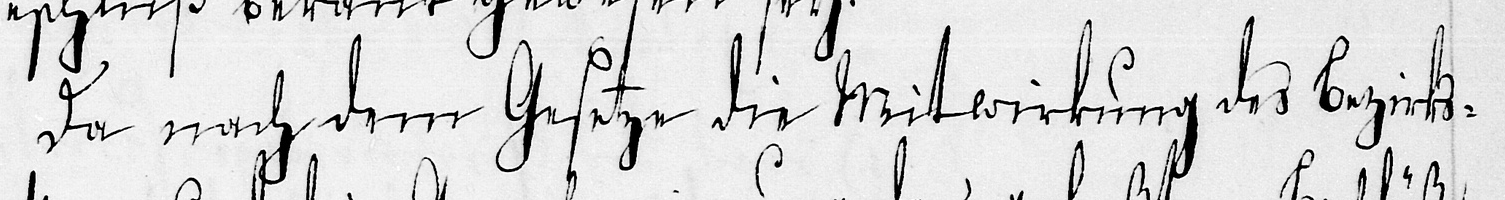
Da nach dem Gesetze die Mitwirkung des Bezirks¬
